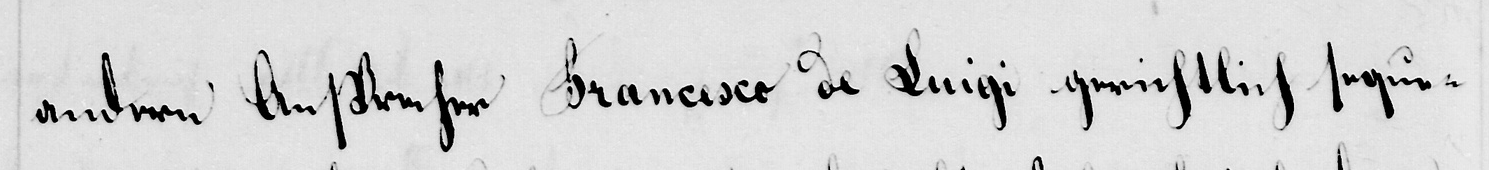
andern Ansprecher Francesco De Luigi gerichtlich seque¬
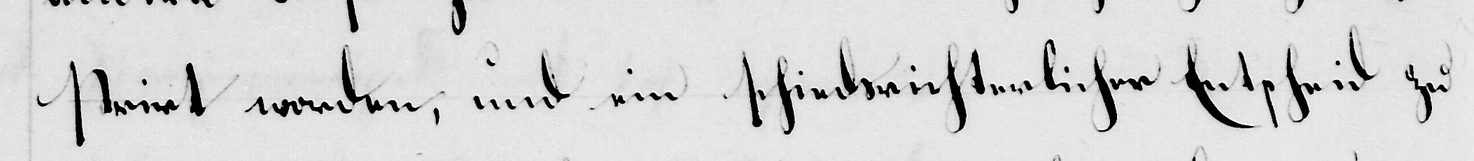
strirt worden, und ein schiedsrichterlicher Entscheid zu
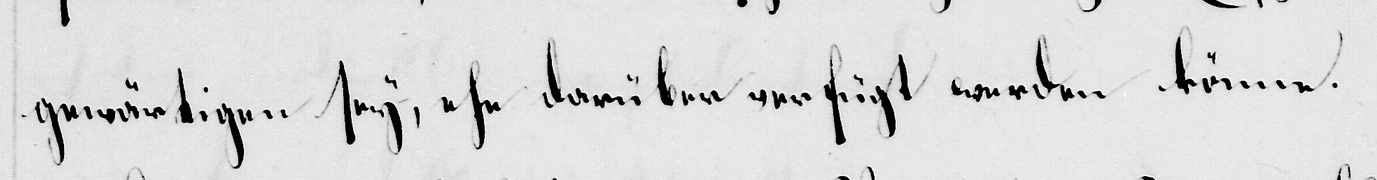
gewärtigen sey, ehe darüber verfügt werden könne.
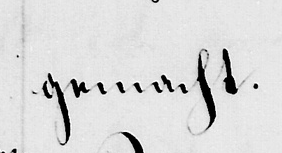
gemacht.
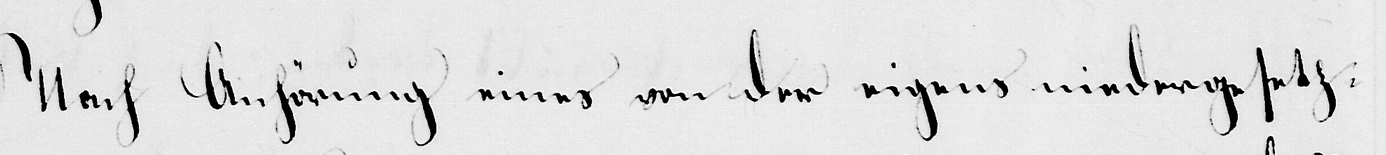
Nach Anhörung eines von der eigens niedergesetz¬
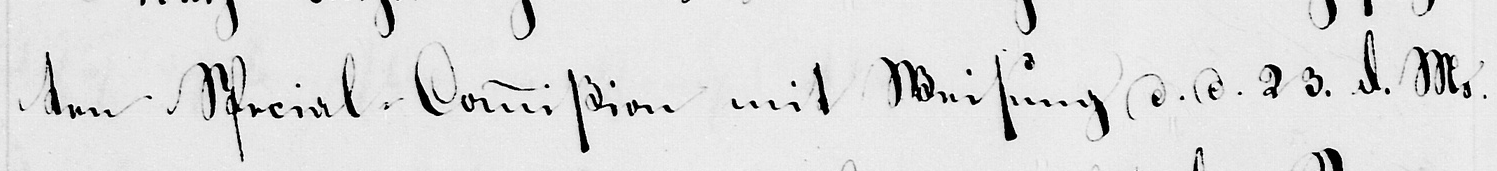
ten Special-Commißion mit Weisung d. d. 23. d. Ms.
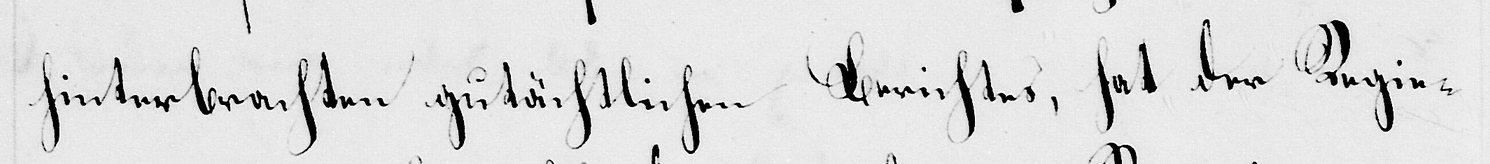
hinterbrachten gutächtlichen Berichtes, hat der Regie¬
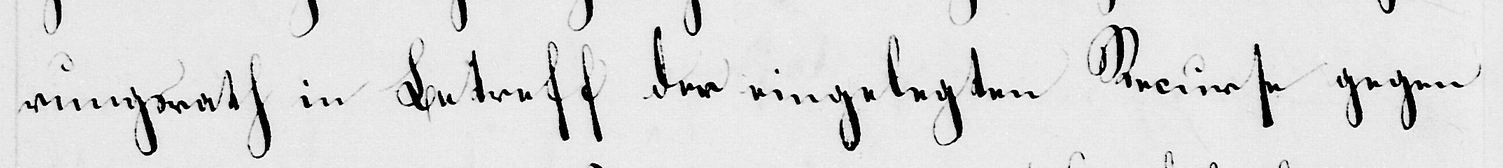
rungsrath in Betreff der eingelegten Recurse gegen
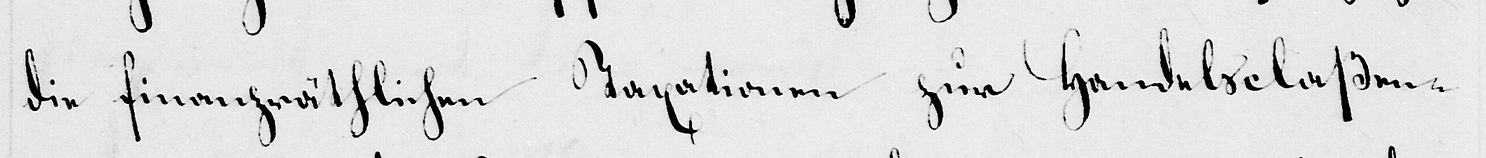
die finanzräthlichen Taxationen zur Handelsclaßen¬
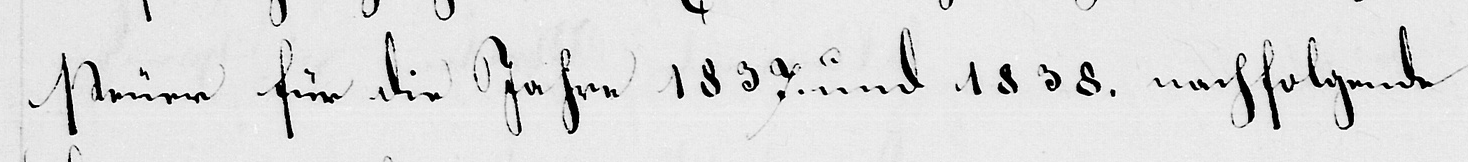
steuer für die Jahre 1837. und 1838. nachfolgende
